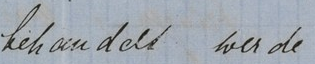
behandelt werde bis
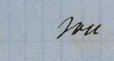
seien.
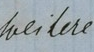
soll aber nur
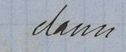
dann
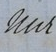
schehen
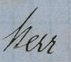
Mercier
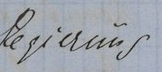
Regierung auf
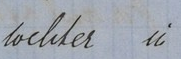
welcher in der
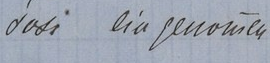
Tosi eingenommen
